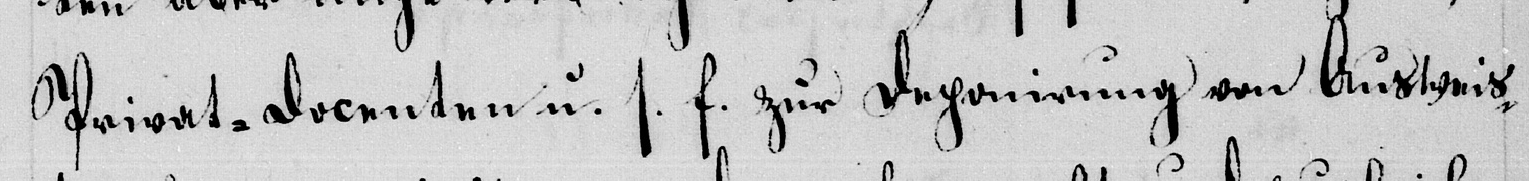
Privat-Docenten u. s. f. zur Deponirung von Ausweis¬
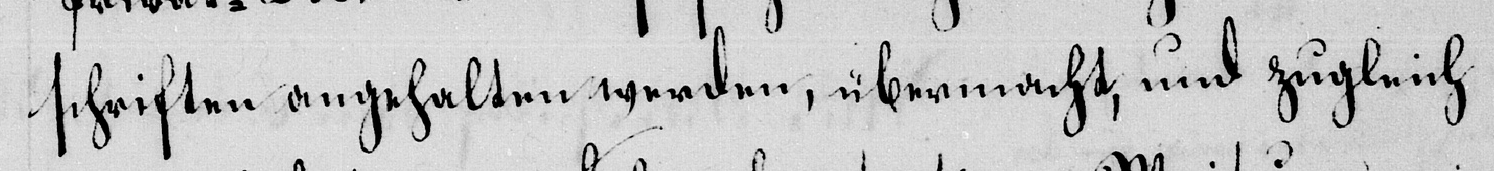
schriften angehalten werden, übermacht, und zugleich
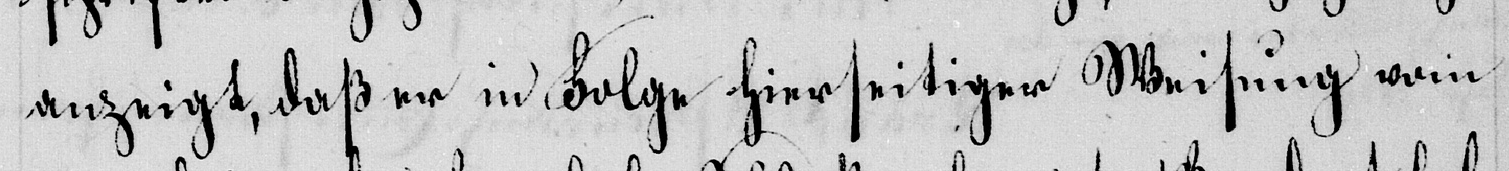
anzeigt, daß er in Folge hierseitiger Weisung vom
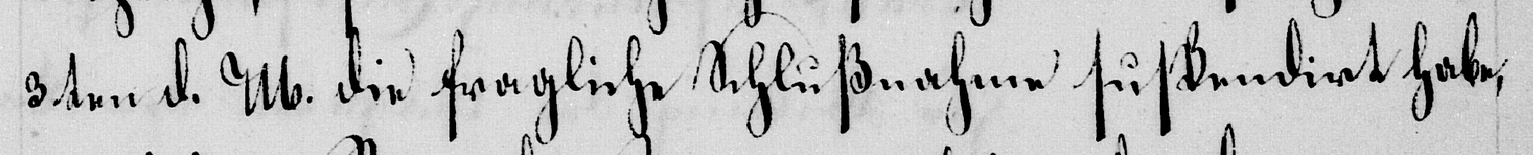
3ten d. M. die fragliche Schlußnahme suspendirt habe,
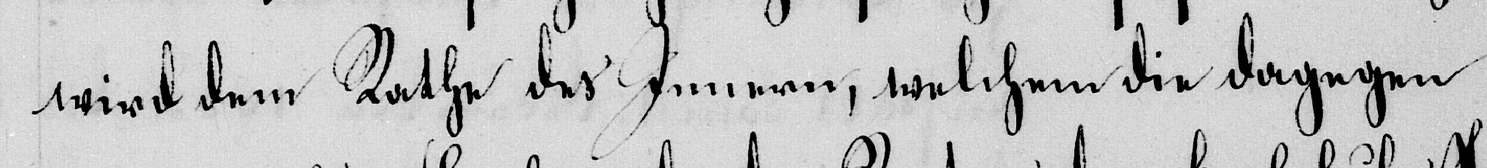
wird dem Rathe des Innern, welchem die dagegen
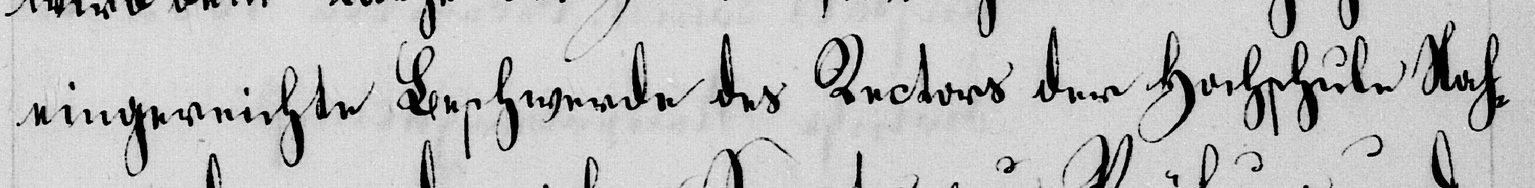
eingereichte Beschwerde des Rectors der Hochschule Nah¬
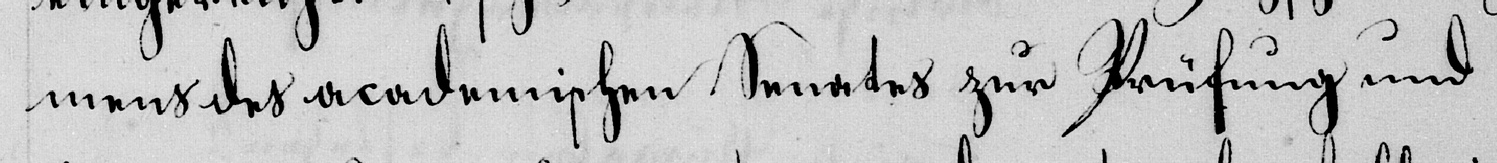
mens des academischen Senates zur Prüfung und
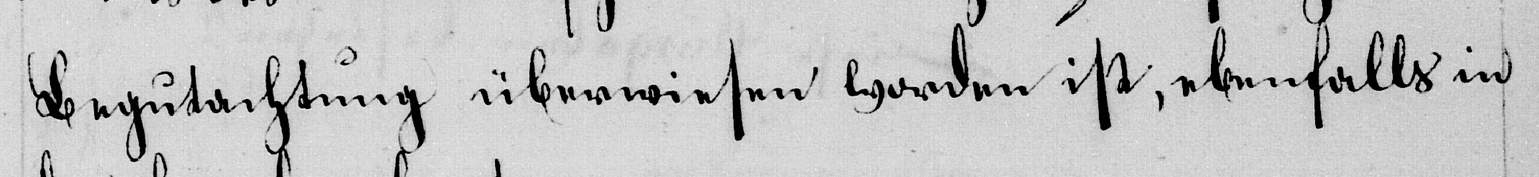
Begutachtung überwiesen worden ist, ebenfalls in
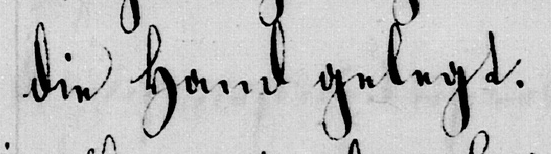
die Hand gelegt.
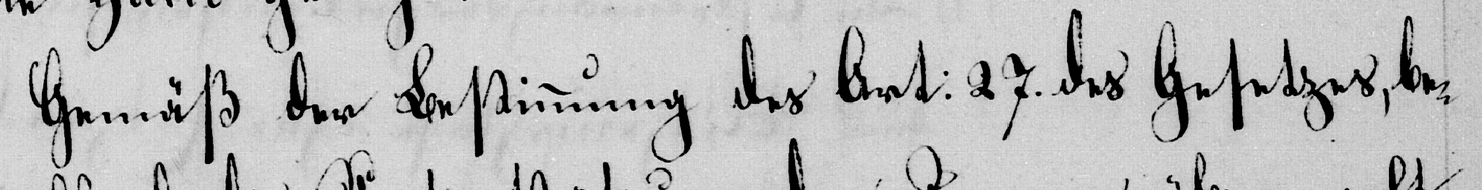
Gemäß der Bestimmung des Art: 27. des Gesetzes, be¬
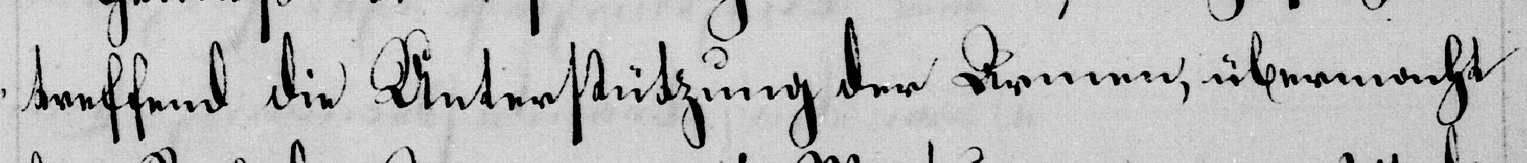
treffend die Unterstützung der Armen, übermacht
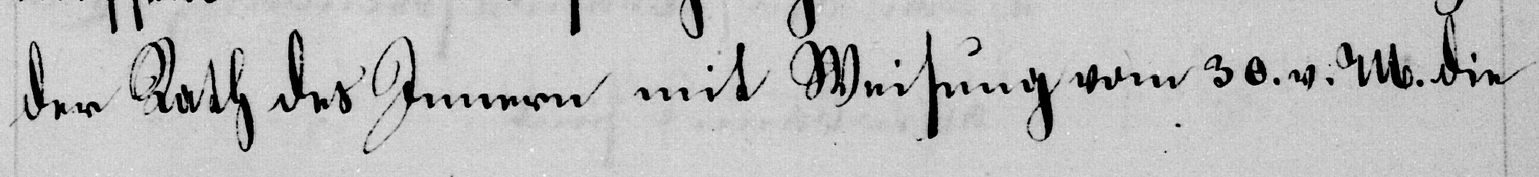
der Rath des Innern mit Weisung vom 30. v. M. die
